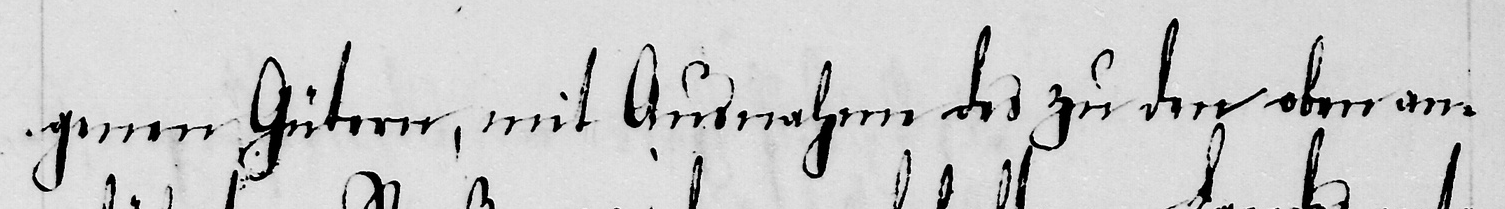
genen Gütern, mit Ausnahme des zu den oben an¬
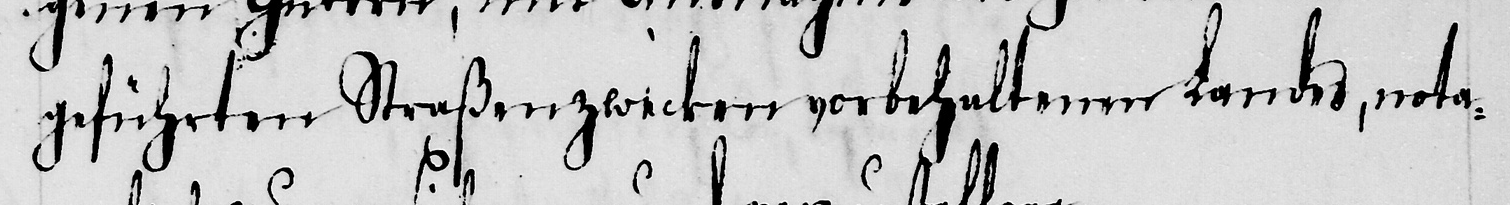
geführten Straßenzwecken vorbehaltenem Landes, nota¬
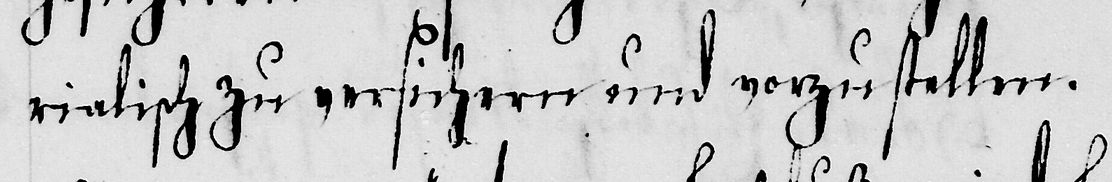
rialisch zu versichern und vorzustellen.
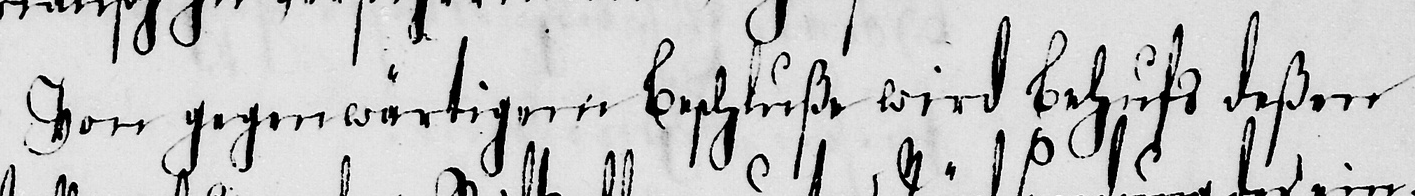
Von gegenwärtigem Beschluße wird Behufs deßen
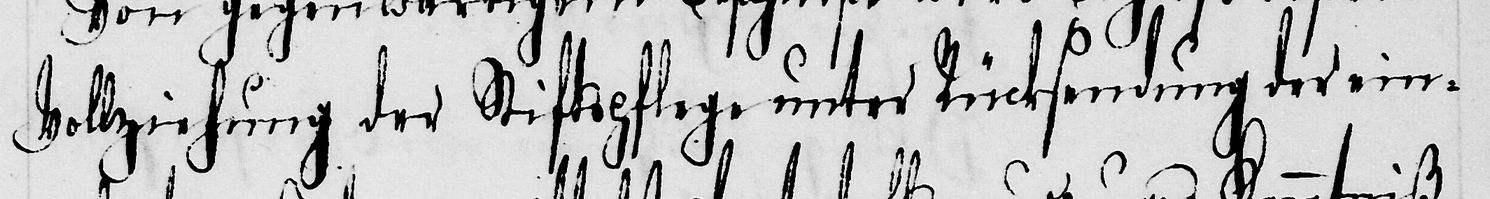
Vollziehung der Stiftspflege unter Rücksendung der ein¬
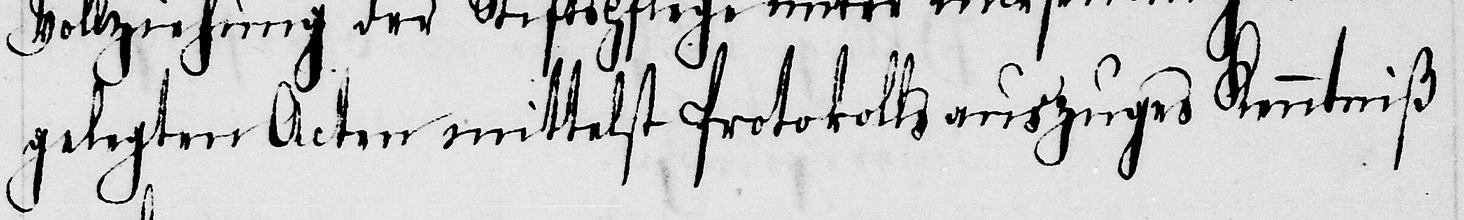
gelegten Acten mittelst Protokollsauszuges Kenntniß
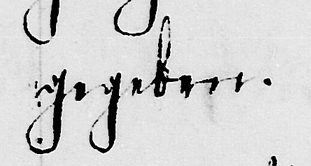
gegeben.
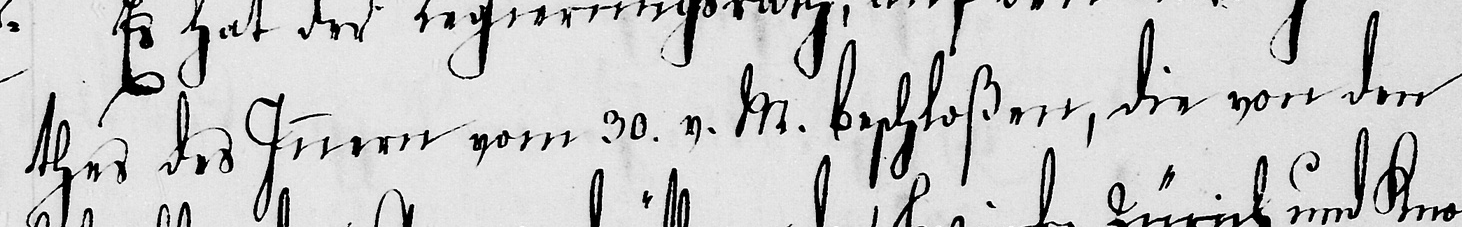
thes des Innern vom 30. v. M. beschloßen, die von den
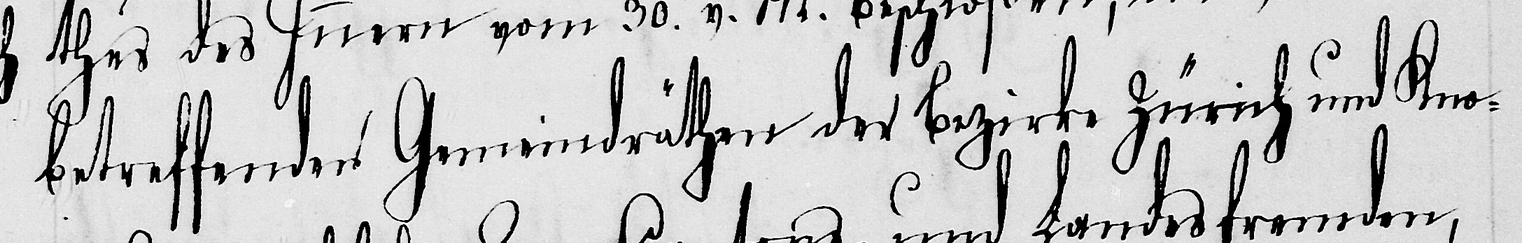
betreffenden Gemeindräthen der Bezirke Zürich und Kno¬
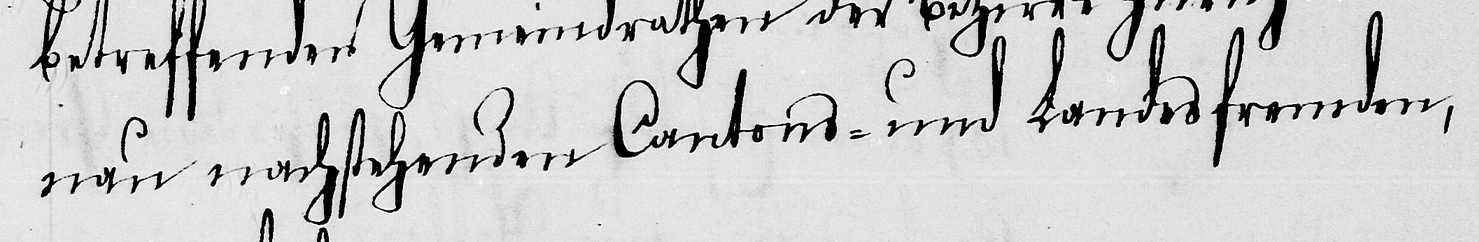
nau nachstehenden Cantons- und Landesfremden,
